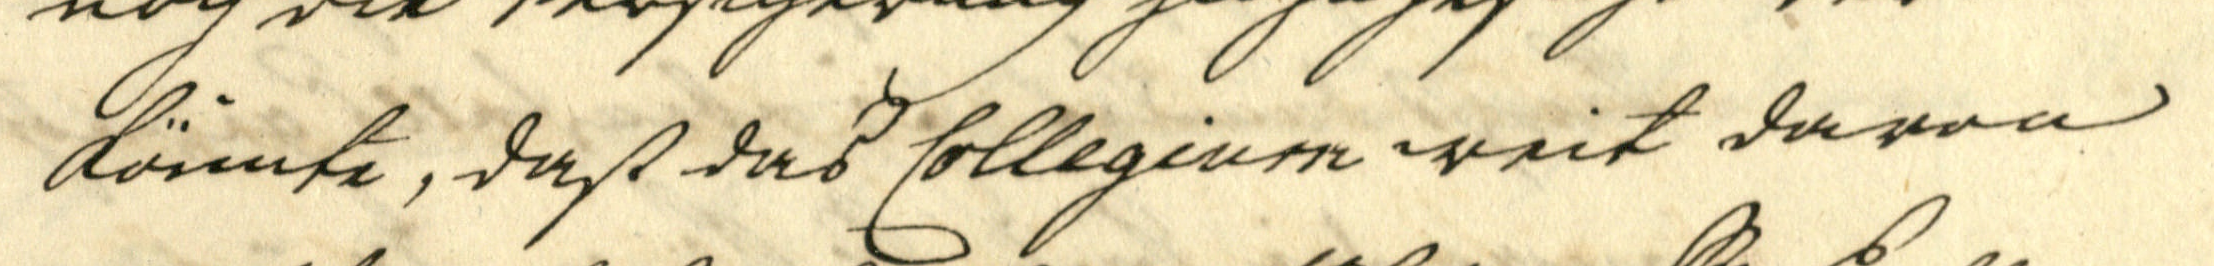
könnte, daß das Collegium weit davon
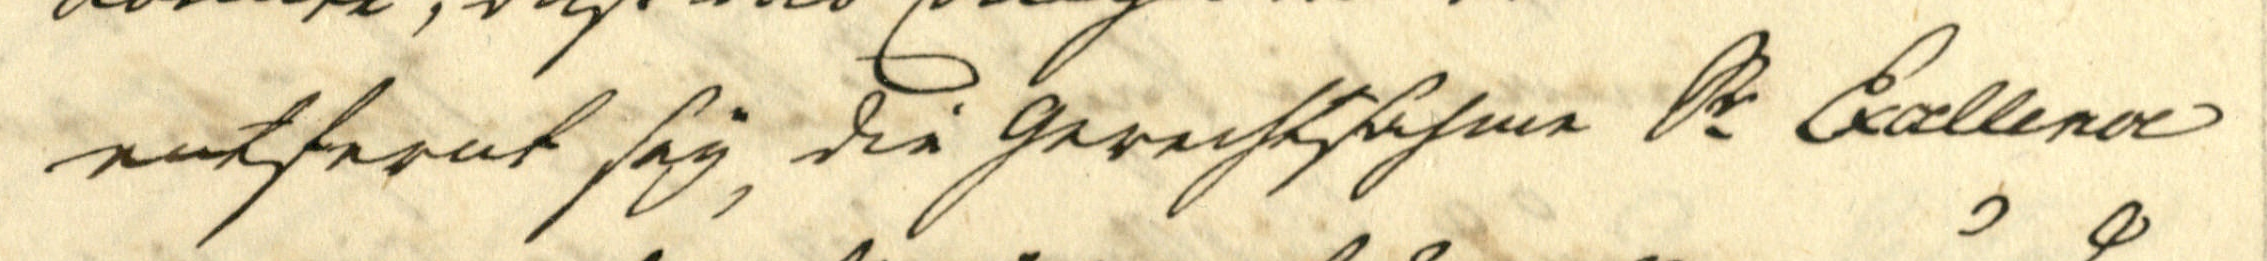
eitfernt seÿ, die Gerechtsahme Sr Excellence
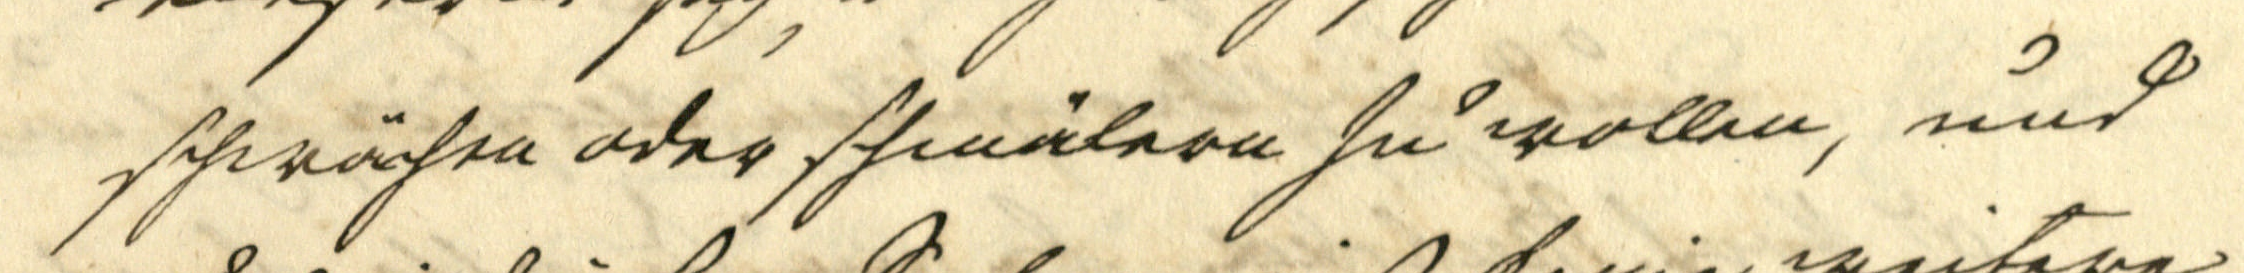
schwächen oder schmälern zu wollen, und
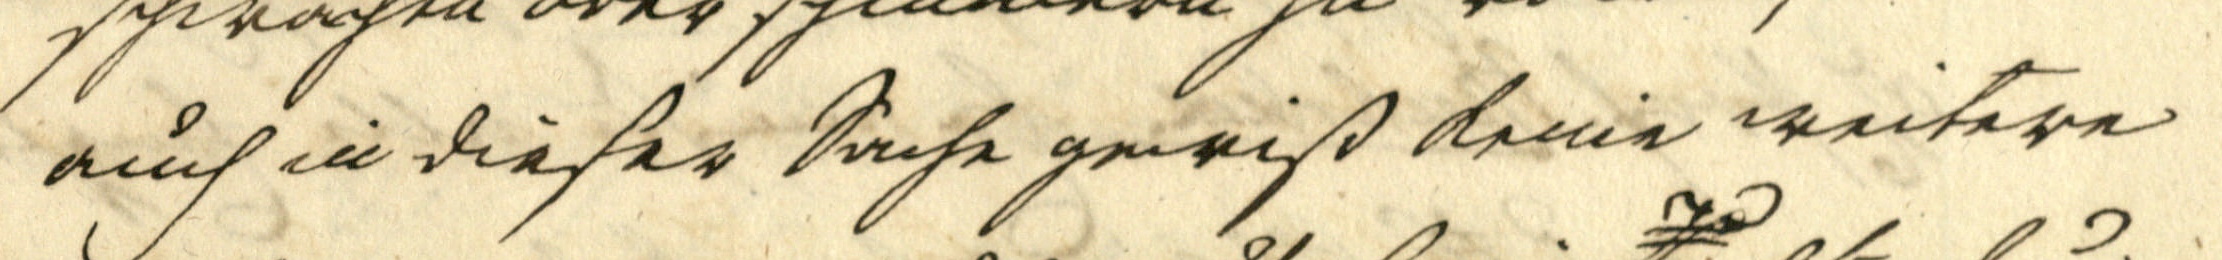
auch in dieser Sache gewiß keine weitere
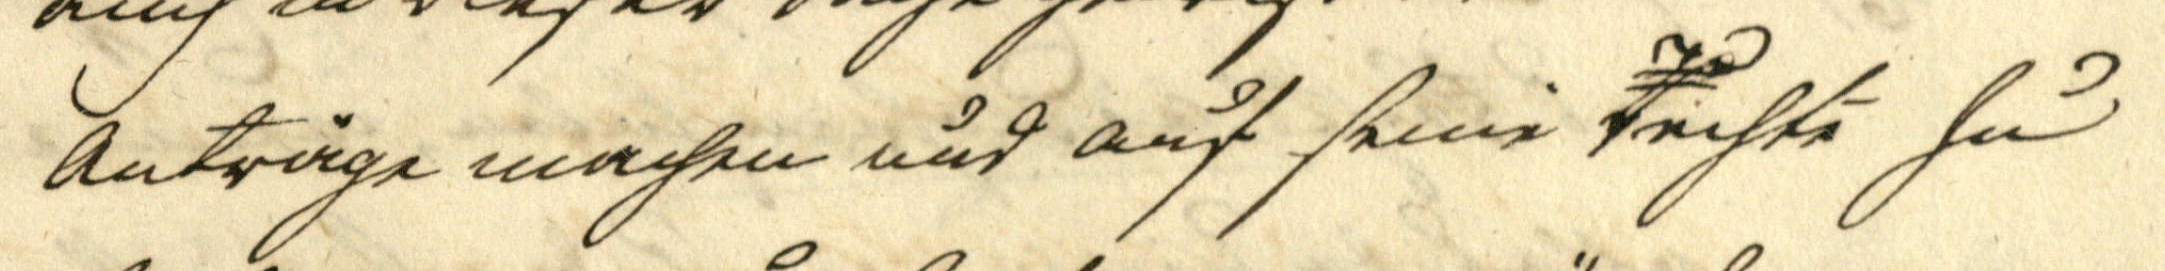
Anträge machen und auf seine Rechte zu
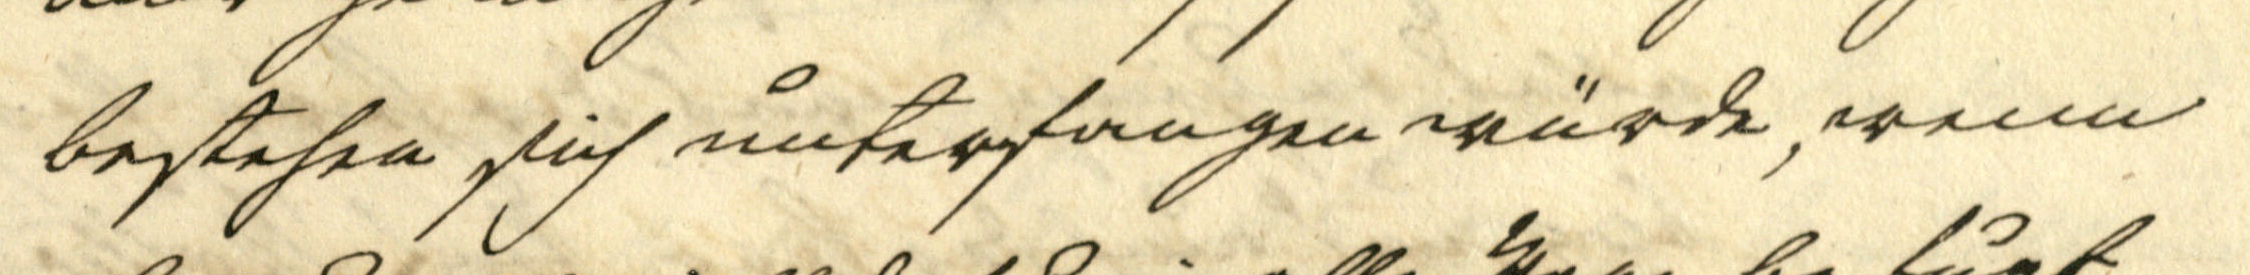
bestehen sich unterfangen würde, wenn
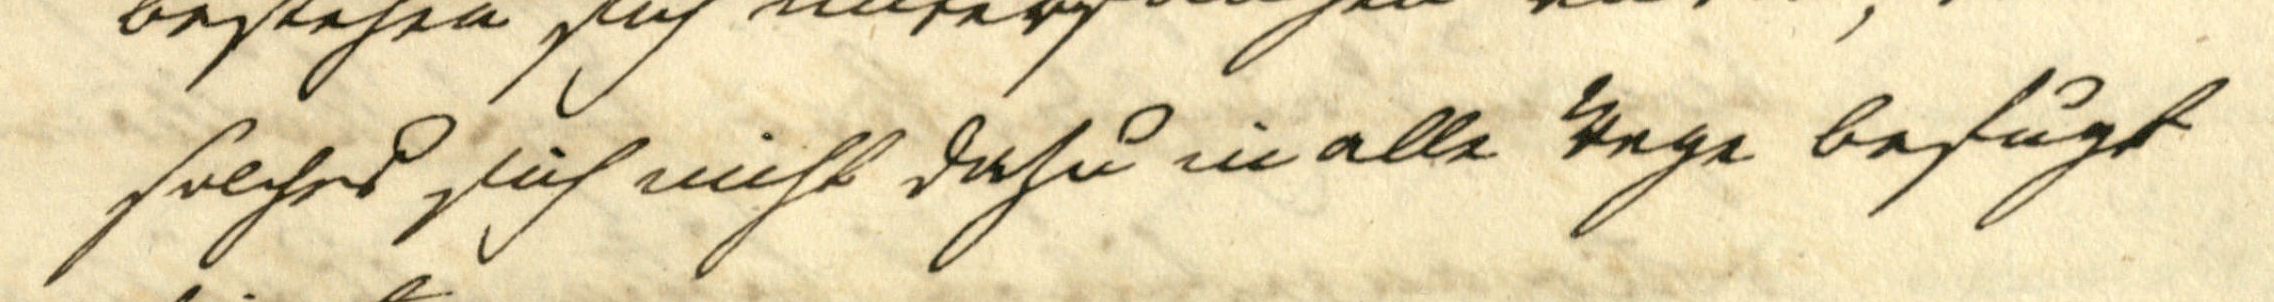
solches sich nicht dazu in alle Wege befugt
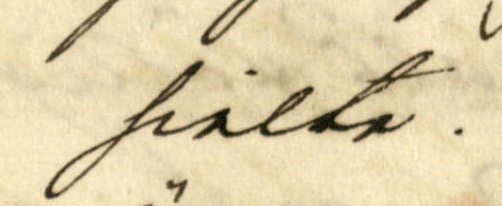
hielte.
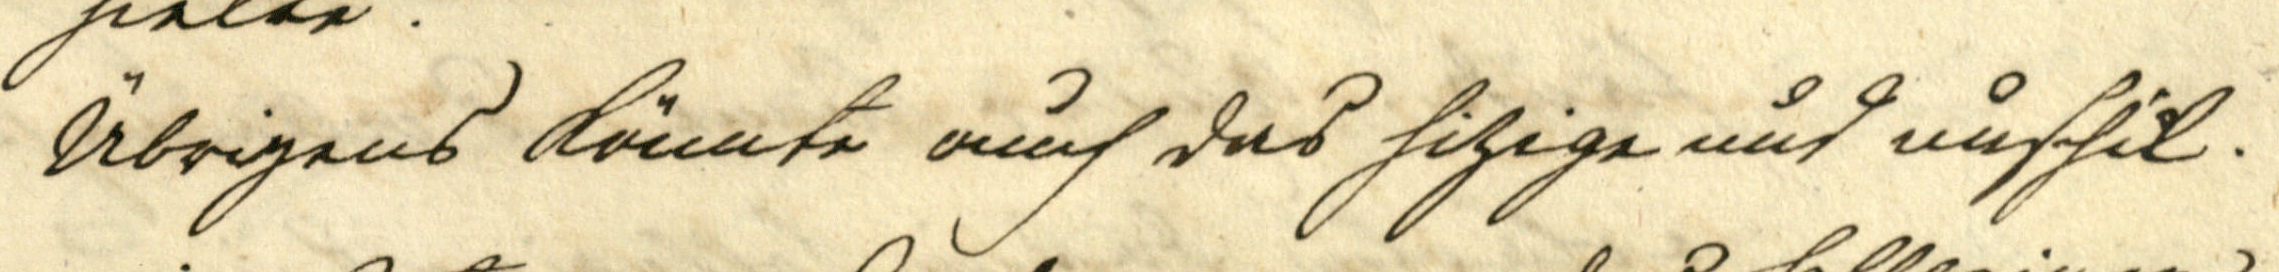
Übrigens könnte auch das hitzige und unschick¬
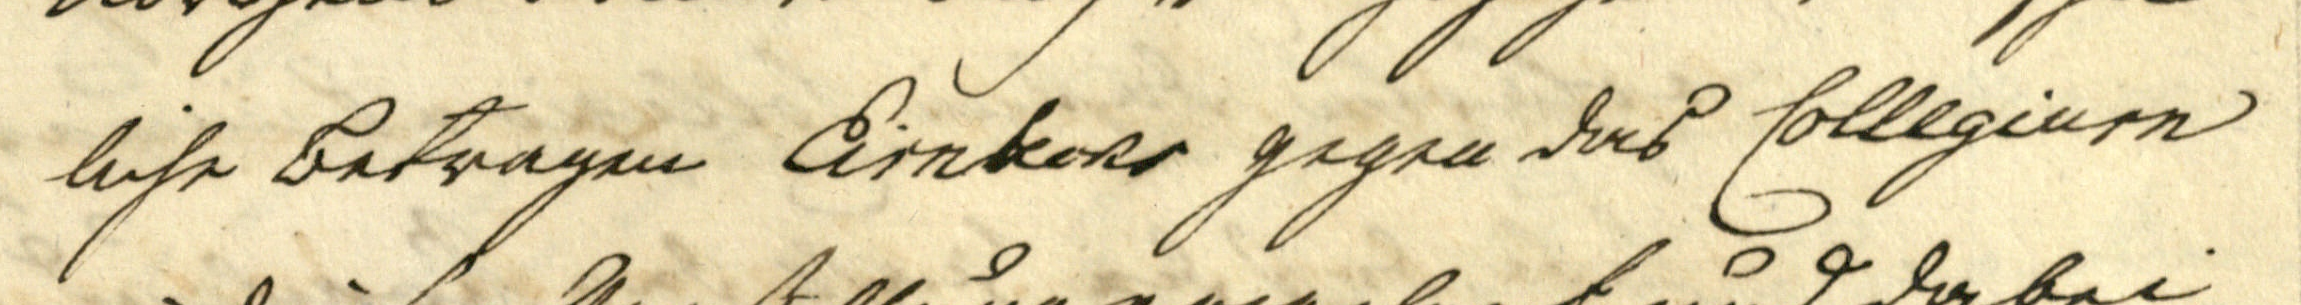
liche Betragen Eimdecks gegen das Collegium
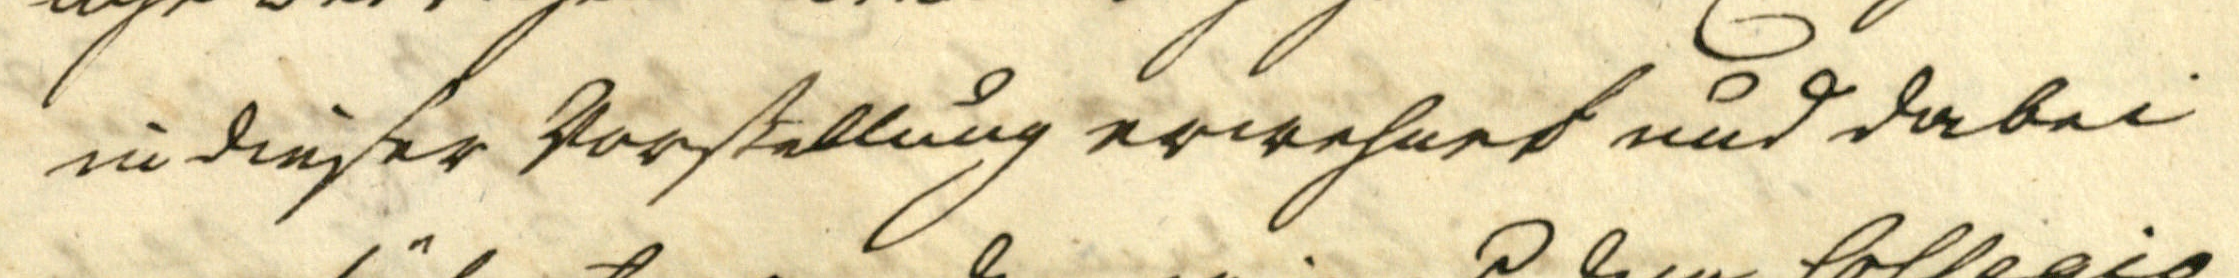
in dieser Vorstellung erwehnet und dabei
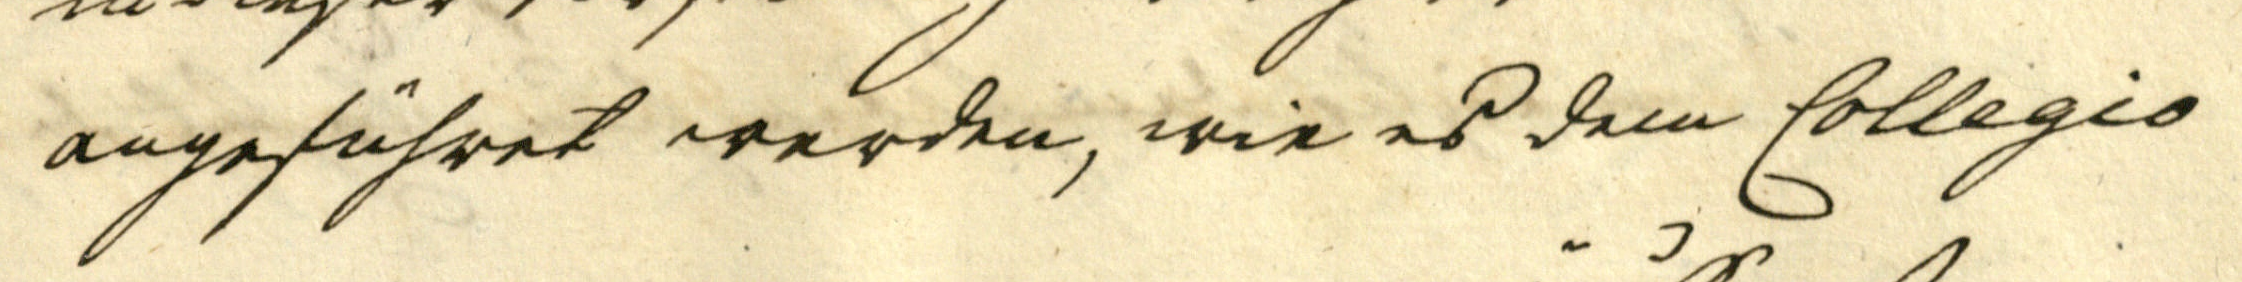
angeführet werden, wie es dem Collegio
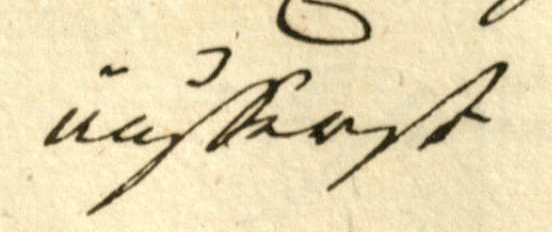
äusserst
